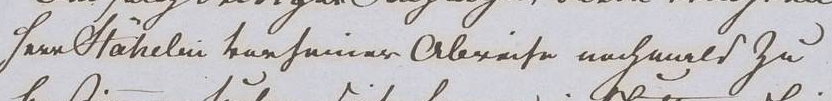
Herr Stähelin vor seiner Abreise nochmals zu
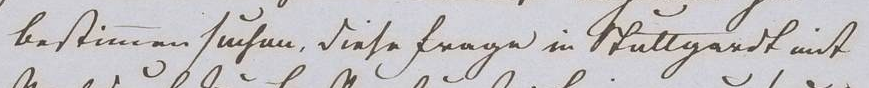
bestimmen suchen, diese Frage in Stuttgardt mit
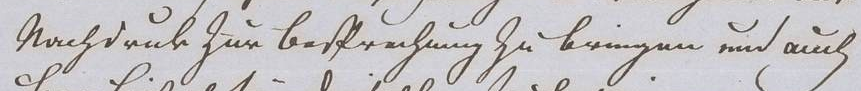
Nachdruk zur Besprechung zu bringen und auch
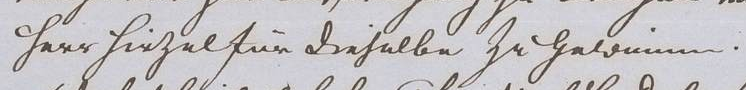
Herr Hirzel für dieselbe zu gewinnen.
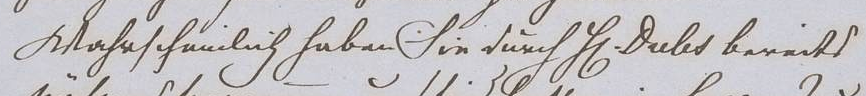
Wahrscheinlich haben Sie durch H. Dubs bereits
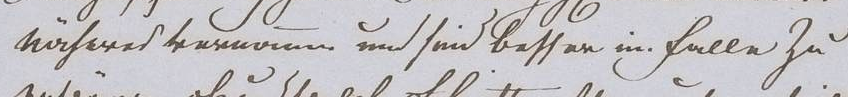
Näheres vernommen und sind besser im Falle zu
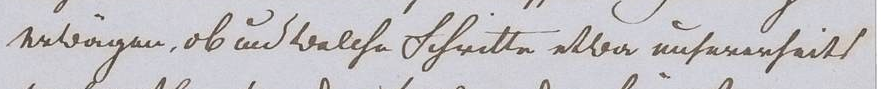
erwägen, ob und welche Schritte etwa unsererseits
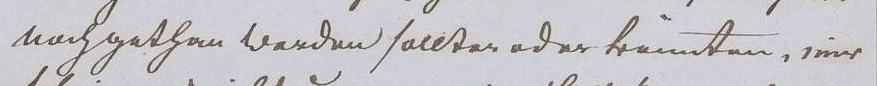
noch gethan werden sollten oder könnten, mir
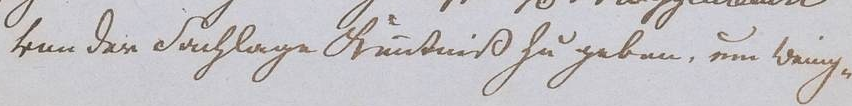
von der Sachlage Kenntniß zu geben, um wenig-
